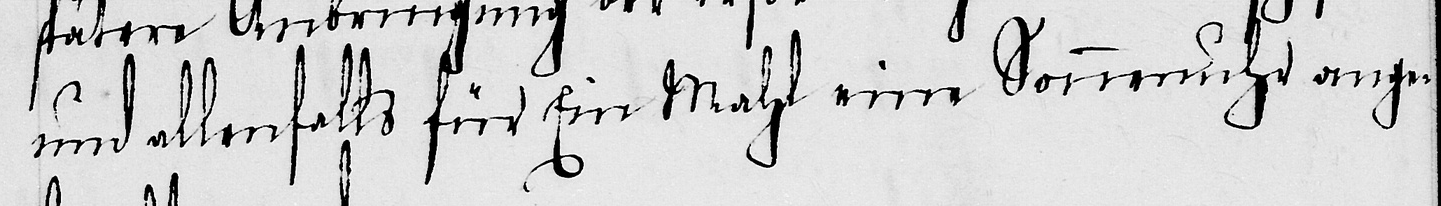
und allenfalls für Ein Mahl eine Sonnenuhr ange¬
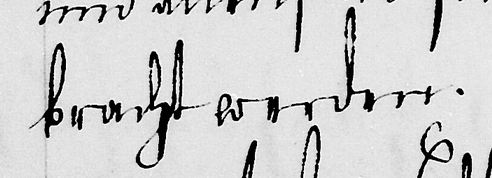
bracht werden.
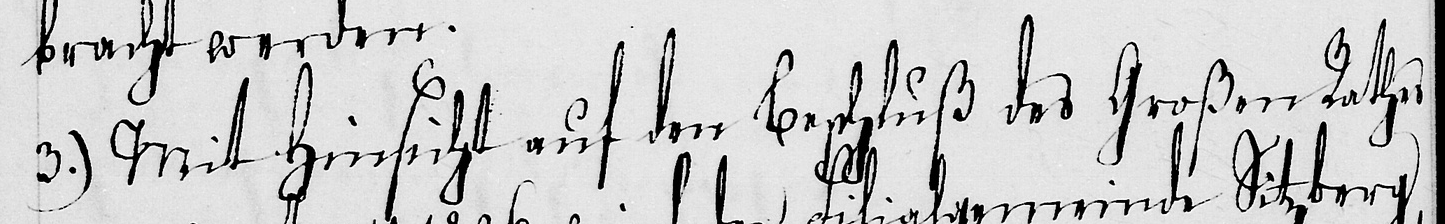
3.) Mit Hinsicht auf den Beschluß des Großen Rathes
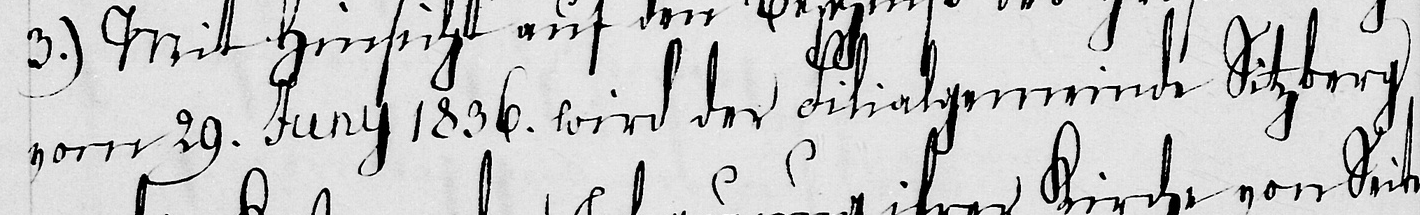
vom 29. Juny 1836. wird der Filialgemeinde Sitzberg
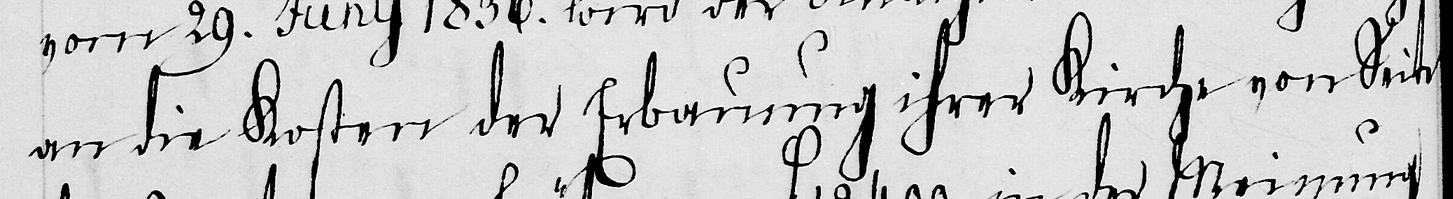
an die Kosten der Erbauung ihrer Kirche von Seite
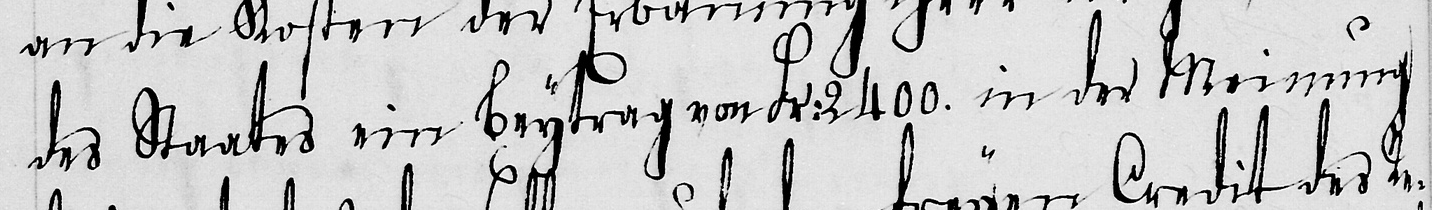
des Staates ein Beytrag von Fr: 2400. in der Meinung
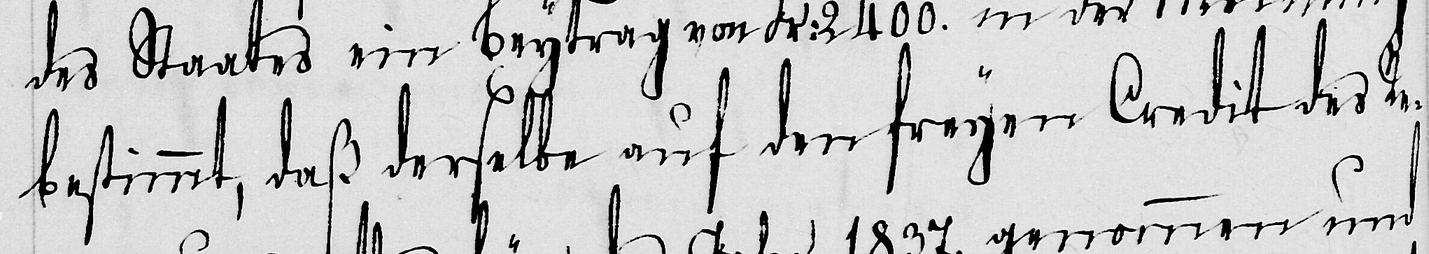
bestimmt, daß derselbe auf den freyen Credit des R¬
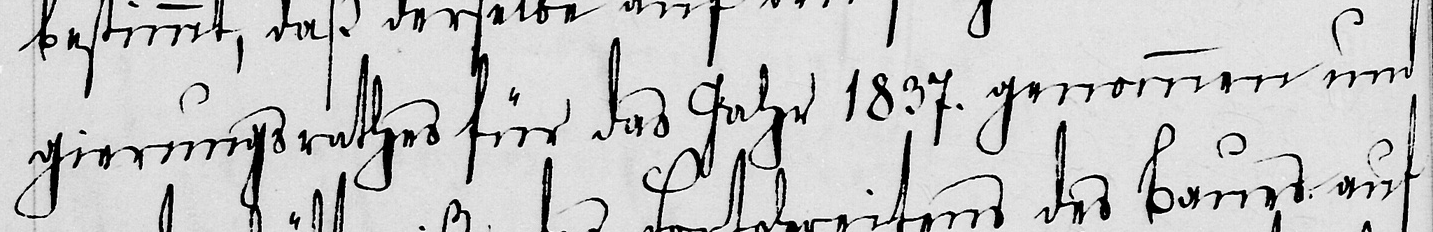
egierungsrathes für daß Jahr 1837. genommen und
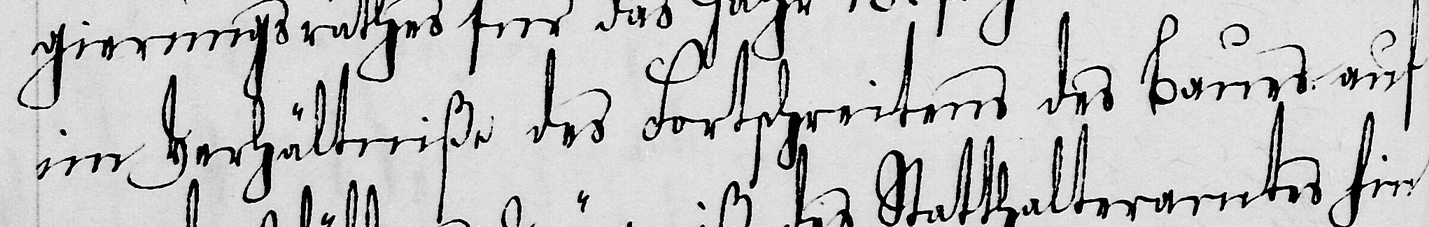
im Verhältniße des Fortschreitens des Baues auf
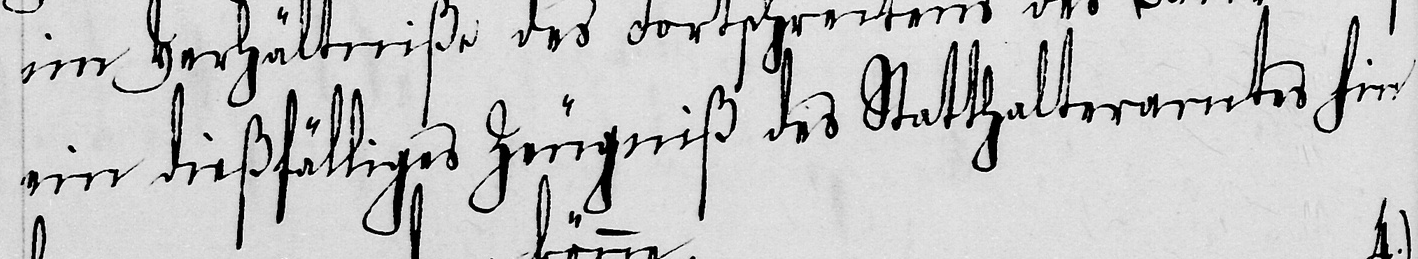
ein dießfälliges Zeugniß des Statthalteramtes hin
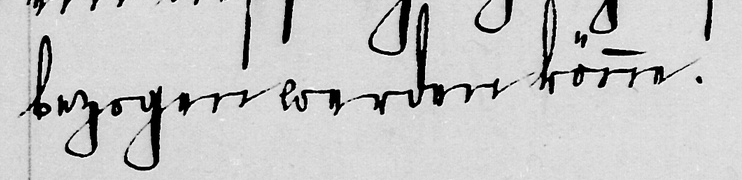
bezogen werden könne.
